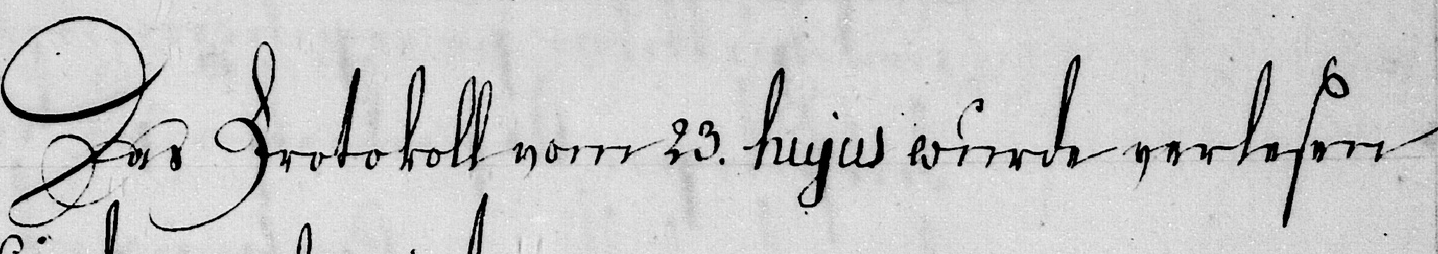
Das Protokoll vom 23. hujus wurde verlesen
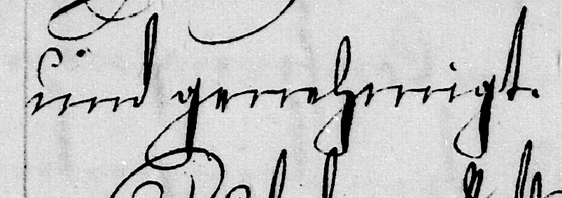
und genehmigt.
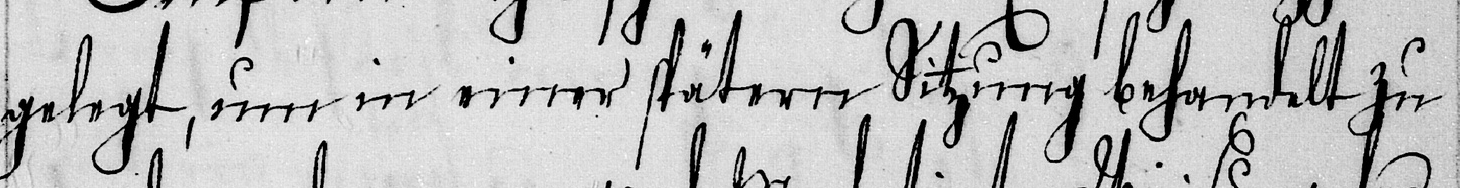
gelegt, um in einer spätern Sitzung behandelt zu
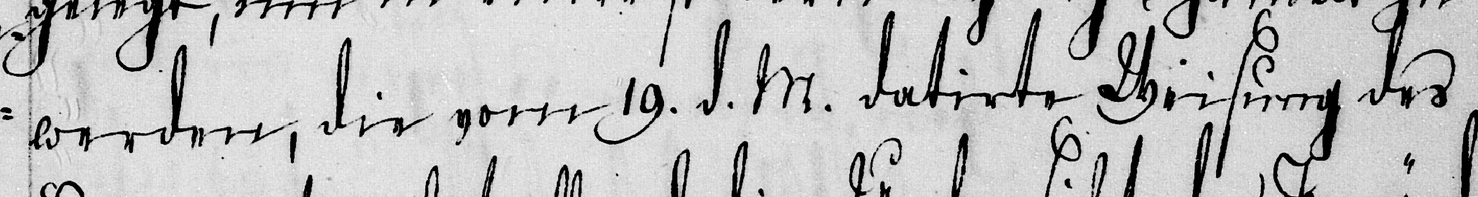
werden, die vom 19. d. M. datirte Weisung des
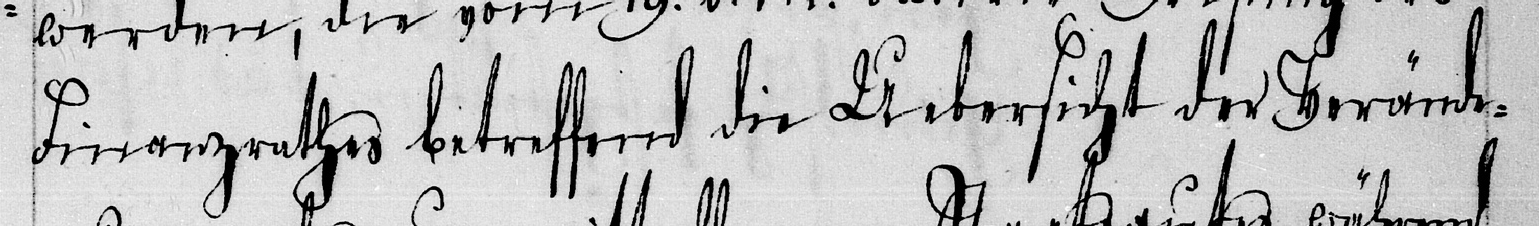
Finanzrathes betreffend die Uebersicht der Verände¬
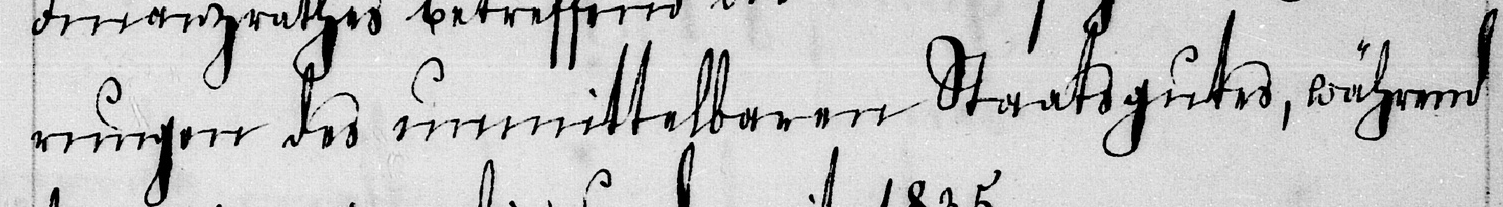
rungen des unmittelbaren Staatsgutes, während
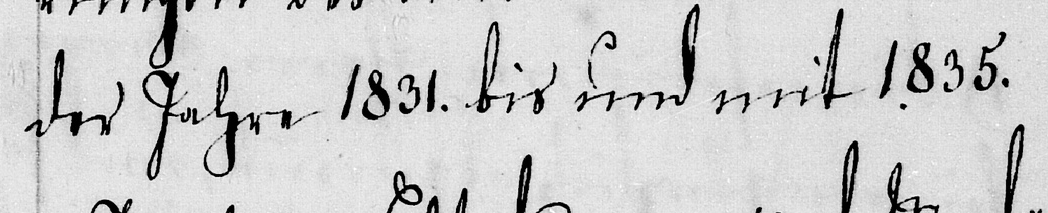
der Jahre 1831. bis und mit 1835.
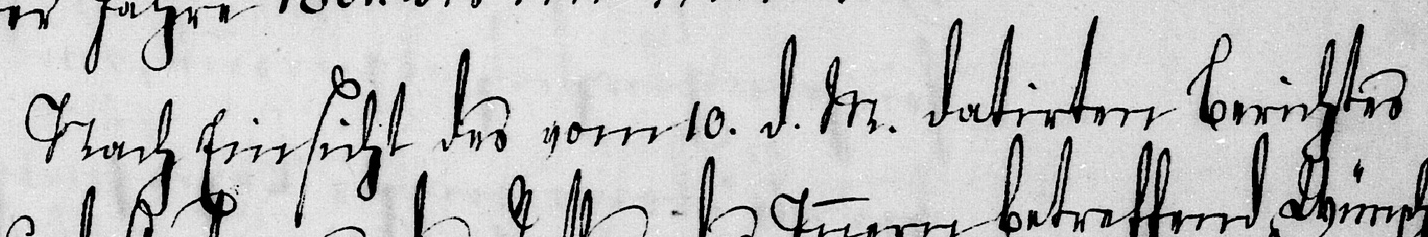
Nach Einsicht des vom 10. d. M. datirten Berichtes
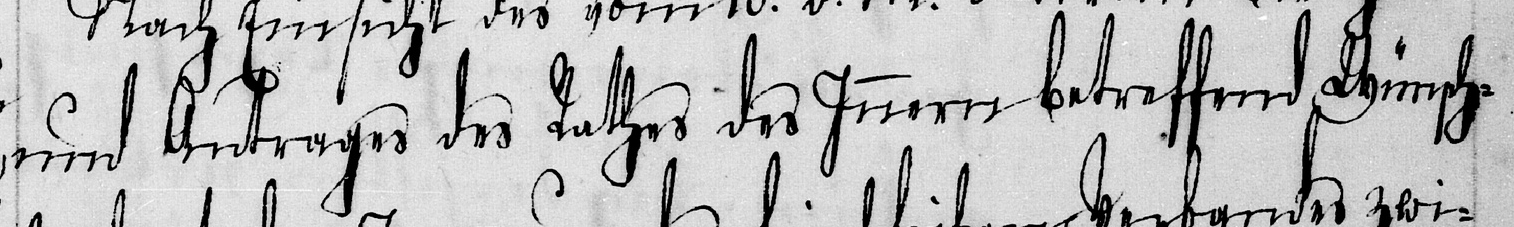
und Antrages des Rathes des Innern betreffend Wünsch¬
